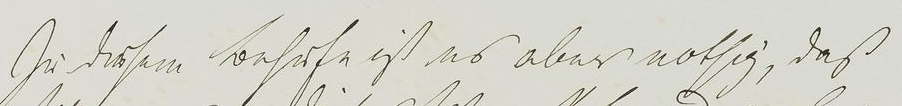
Zu diesem Behufe ist es aber nöthig, daß
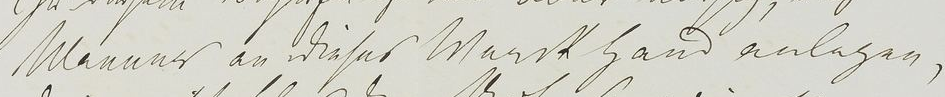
Männer an dieses Werck Hand anlegen,
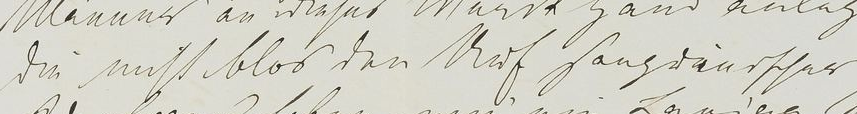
die nicht blos den Ruf sanguinischer
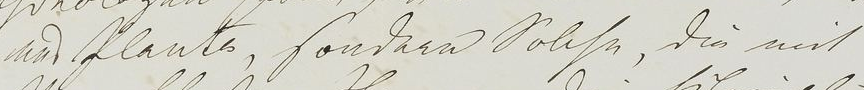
und Planta, sondern Solche, die mit
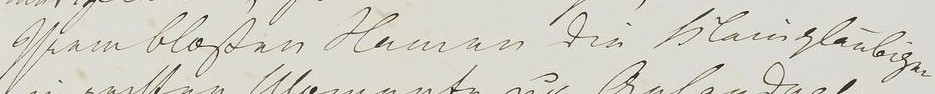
Ihrem bloßen Namen die Kleingläubigen
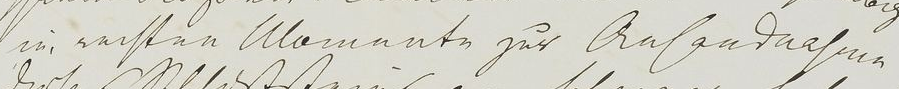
im rechten Momente zur Anhandnahme
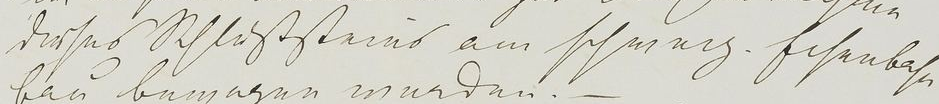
dieses Schlußsteins am schweiz. Eisenbahn-
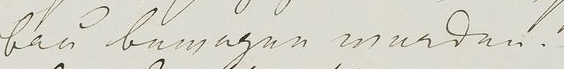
bau bewegen würden. –
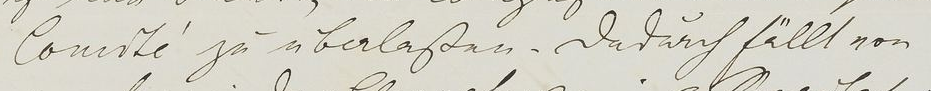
Comité zu überlaßen. Dadurch fällt von
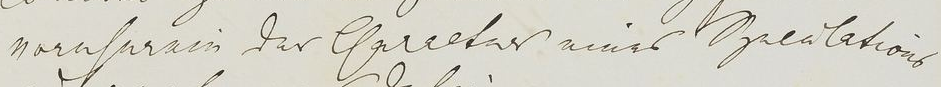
vornherein der Character eines Speculations-
